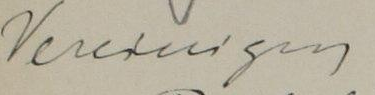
Vereinigung
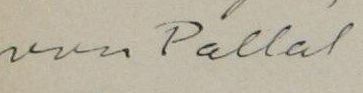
von Pallal
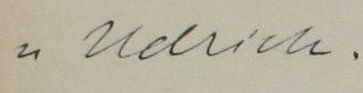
u. Uddrich
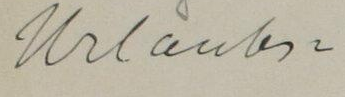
Urlaubs-
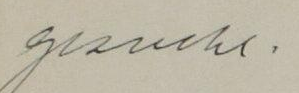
gesuche.
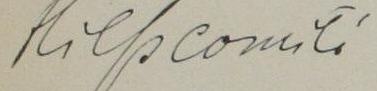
Hilfscomité
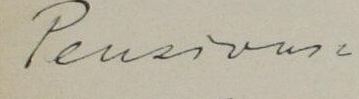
Pensions-
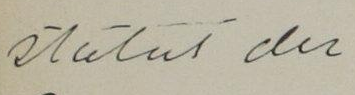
statut der
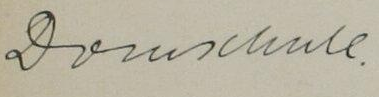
Domschule.
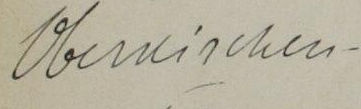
Oberkirchen-
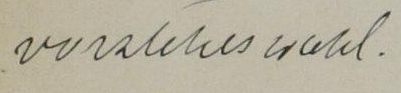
vorsteherwahl.
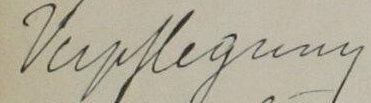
Verpflegung
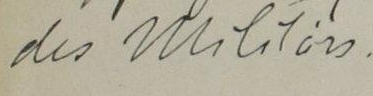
des Militärs.
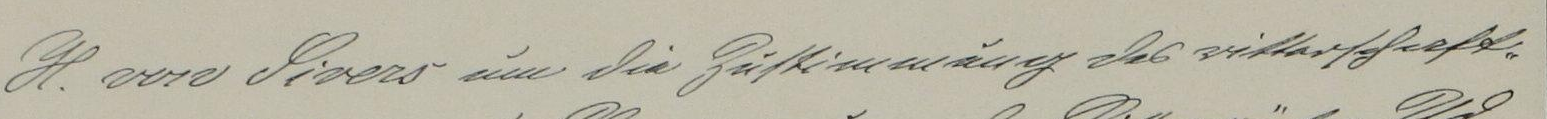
H. von Sivers um die Zustimmung des ritterschaft-
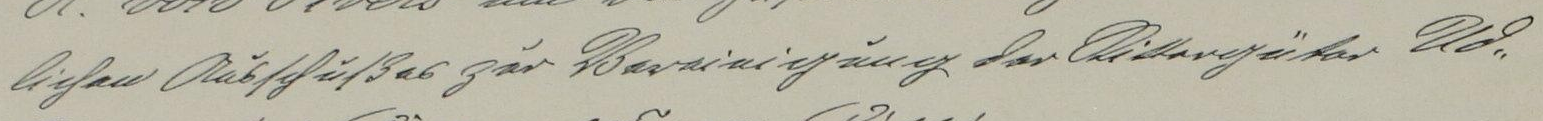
lichen Ausschußes zur Vereinigung der Rittergüter Ud-
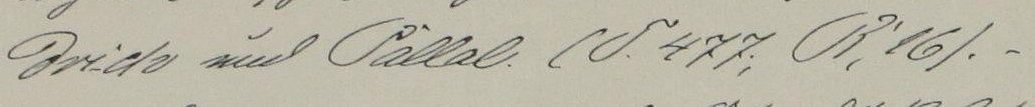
drich und Pallal (T.477; R.16).
